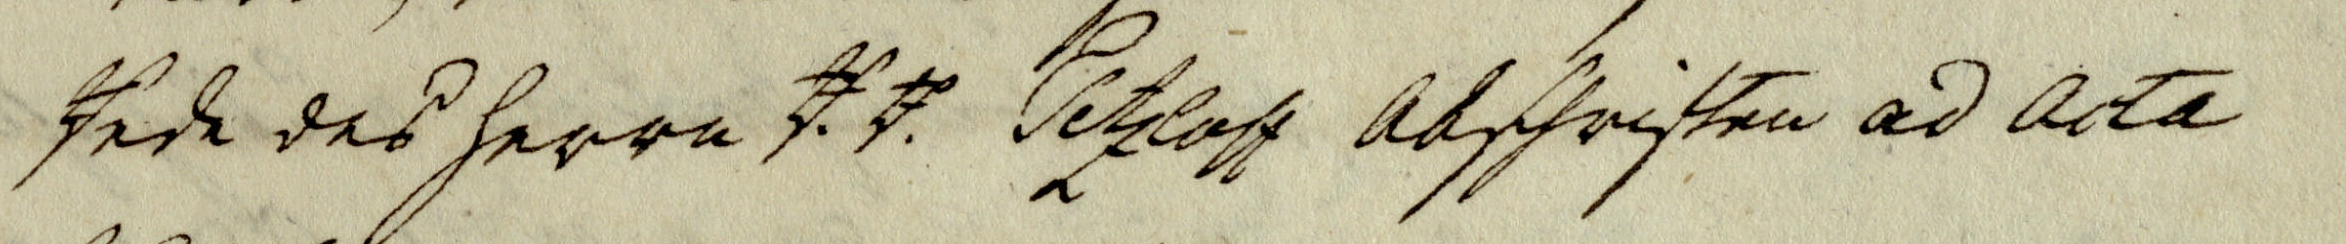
Rede des Herrn R. R. Tetzloff Abschriften ad Acta
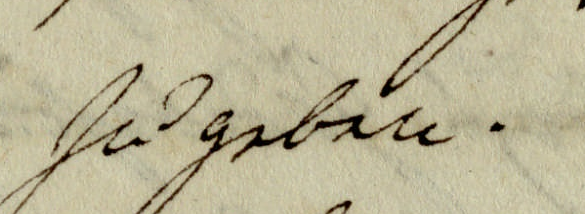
zu geben.
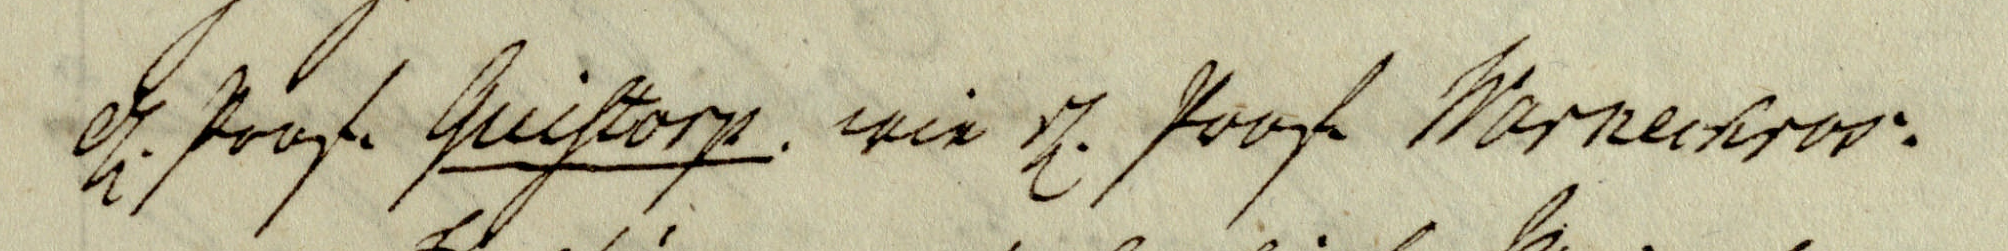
dh. Prof. Quistorp. wie dh. Prof. Warneckros.
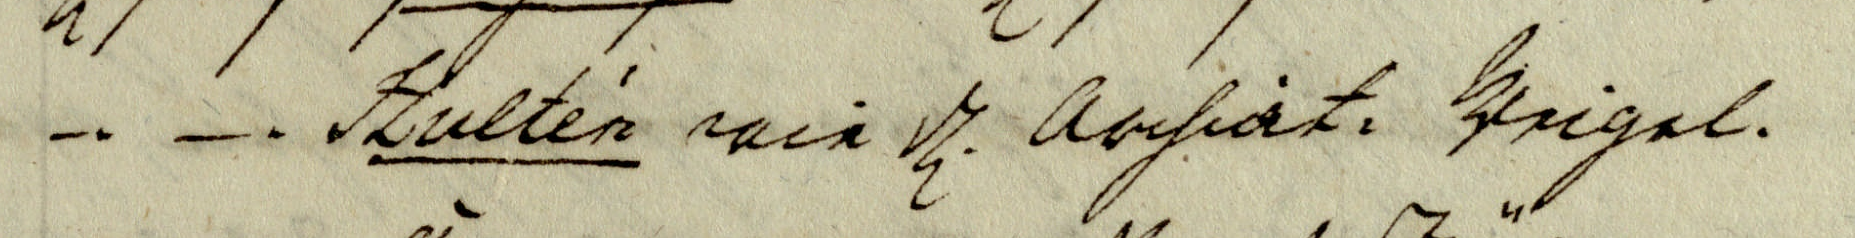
Hultén wie dh. Archiät. Weigel.
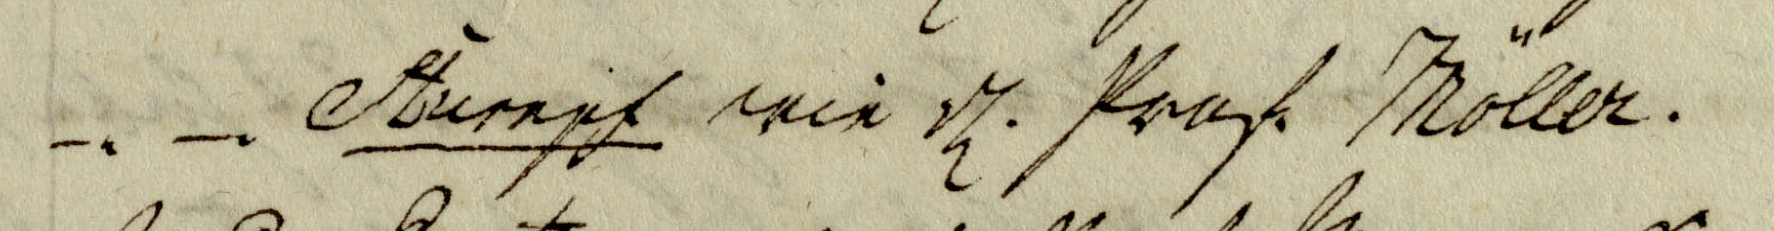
Stumpf. wie dh. Prof. Möller.
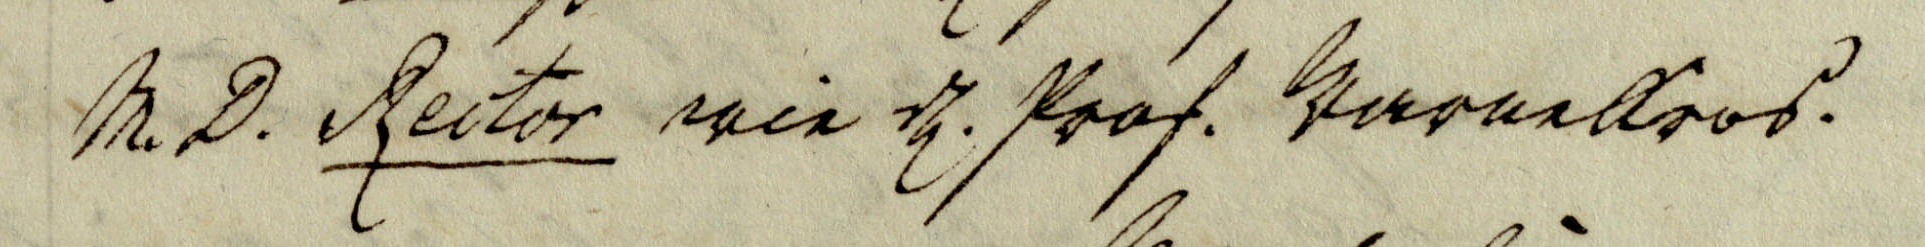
M. D. Rector wie dh. Prof. Warnekros.
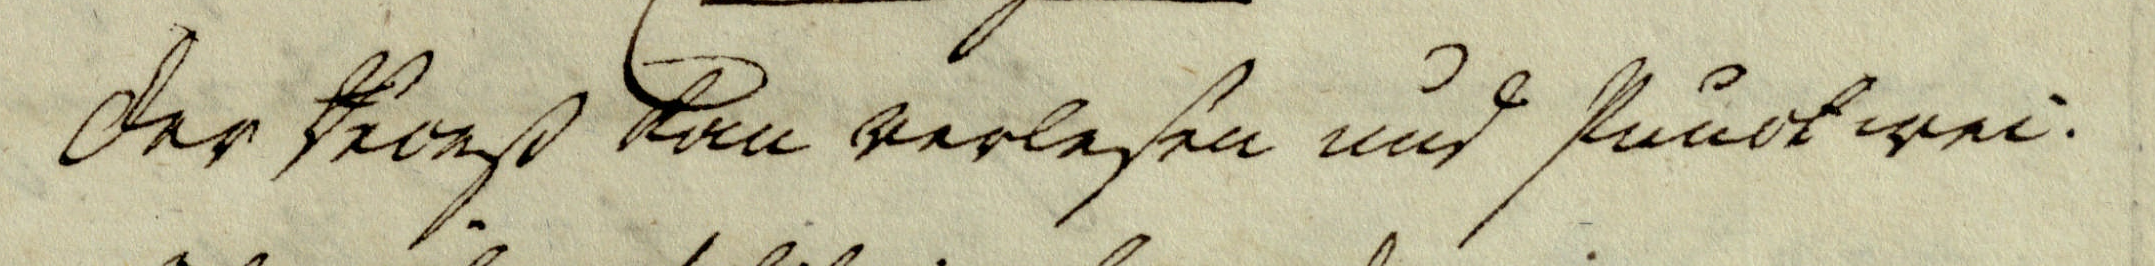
Der Receß kan verlesen und Punktwei¬
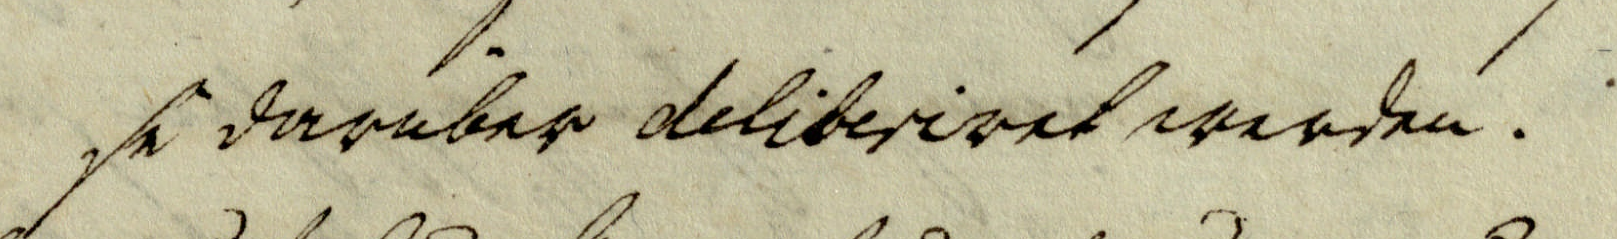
se darüber deliberiret werden.
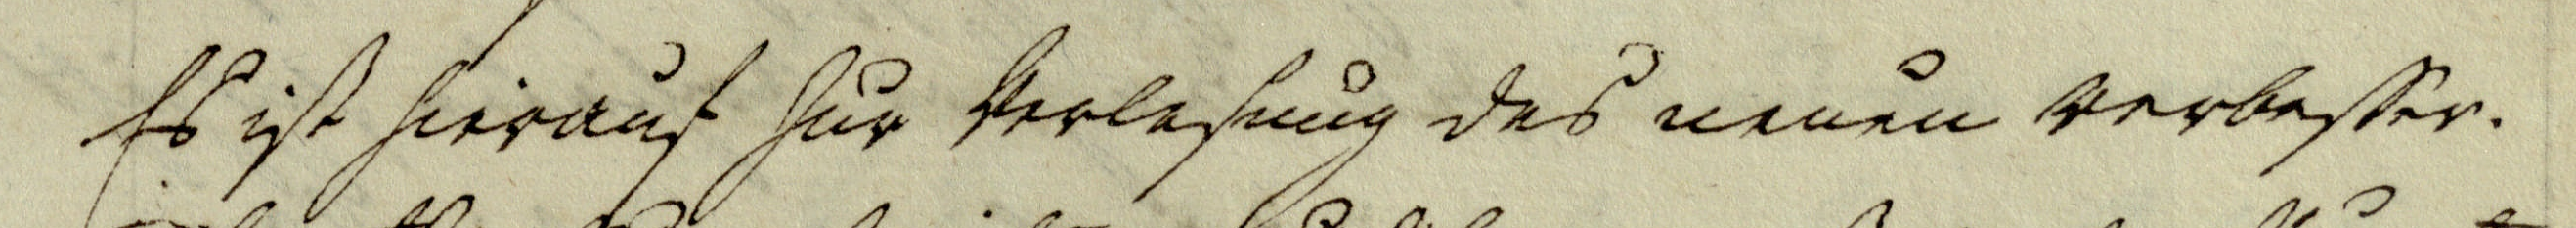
Es ist hierauf zur Vorlesung des neuen verbesser¬
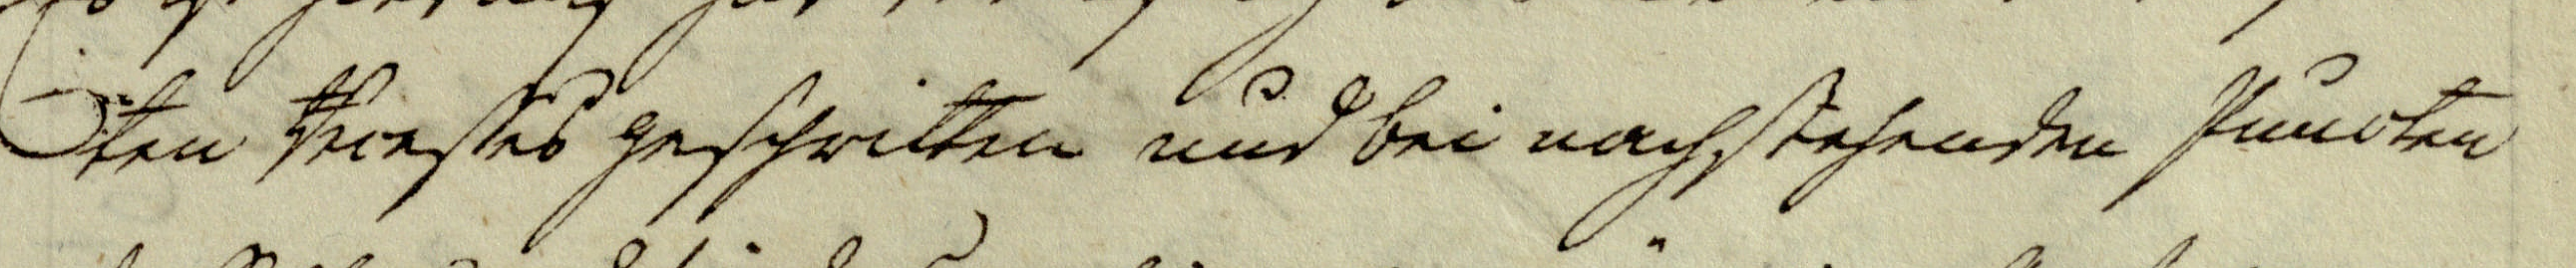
ten Recesses geschritten und bei nachstehenden Puncten
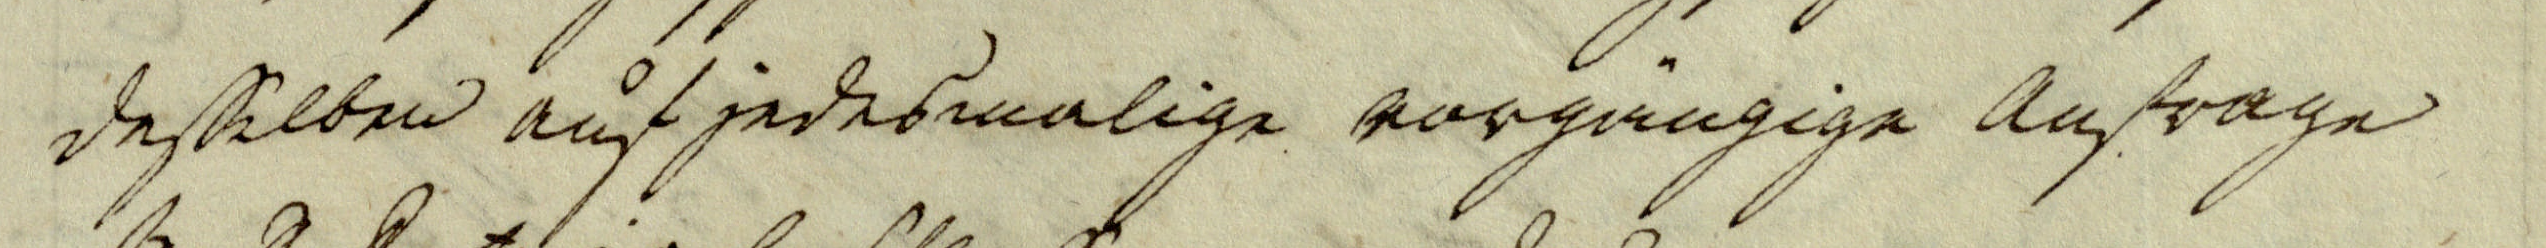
desselben auf jedesmalige vorgängige Anfrage
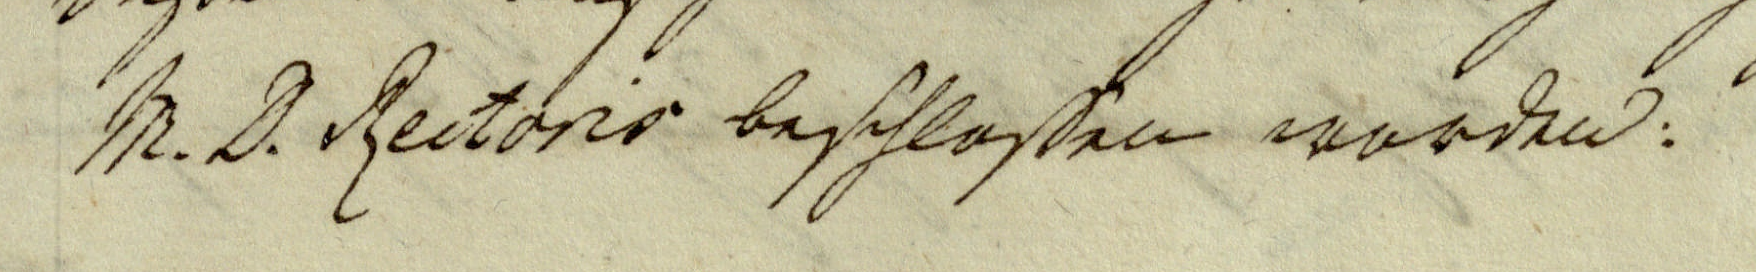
M. D. Rectoris beschlossen worden.
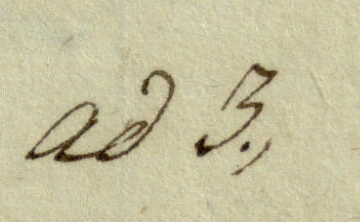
ad. 3.,
